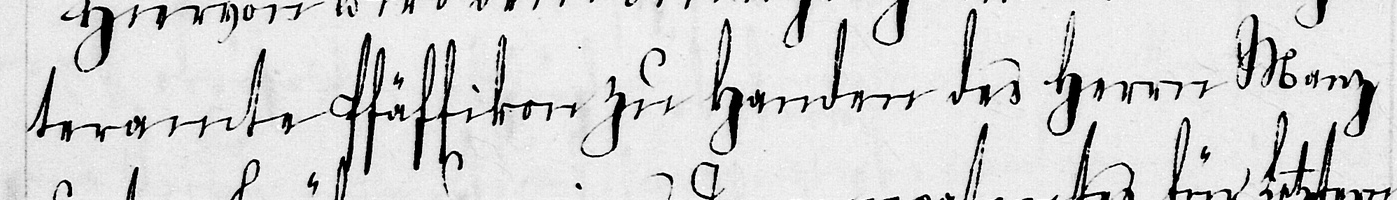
lteramte Pfäffikon zu Handen des Herrn Manz
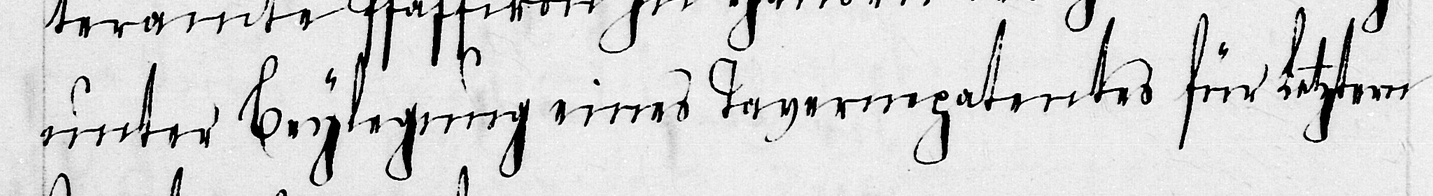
unter Beylegung eines Tavernepatentes für Letztern
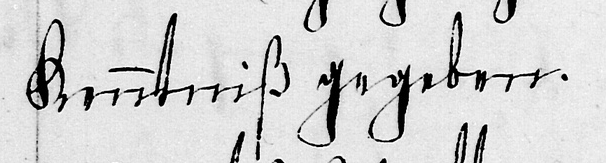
Kenntniß gegeben.
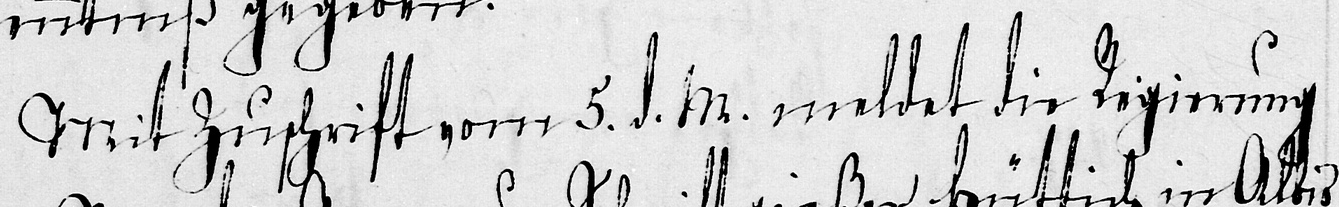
Mit Zuschrift vom 5. d. M. meldet die Regierung
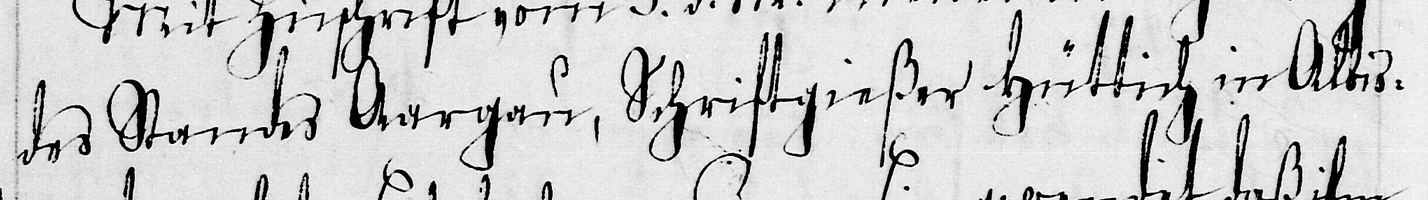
des Standes Aargau, Schriftgießer Hüttich in Albis¬
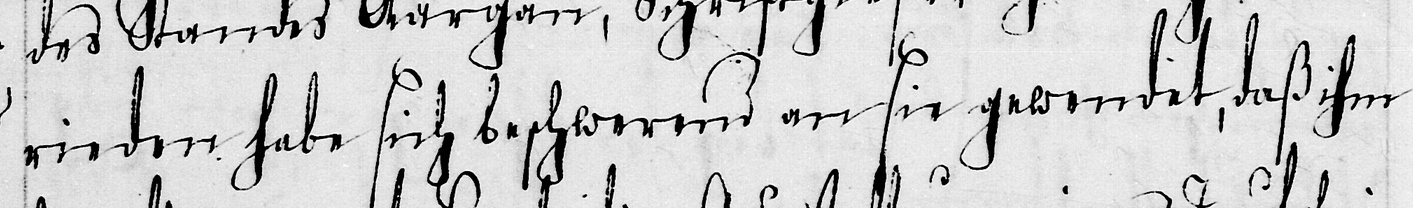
rieden habe sich beschwerend an sie gewendet, daß ihm
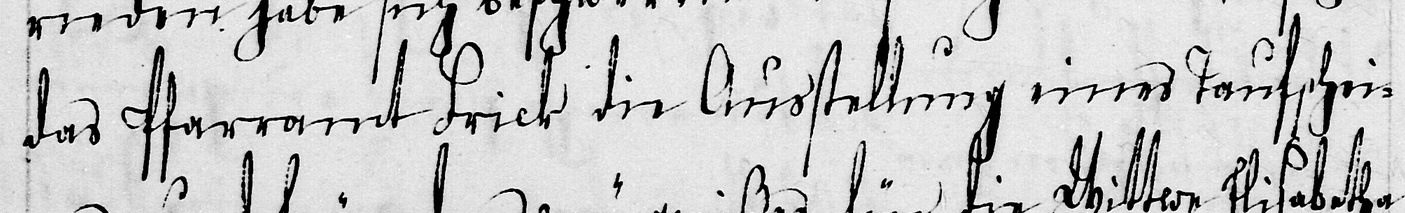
das Pfarramt Frick die Ausstellung eines Taufsche¬
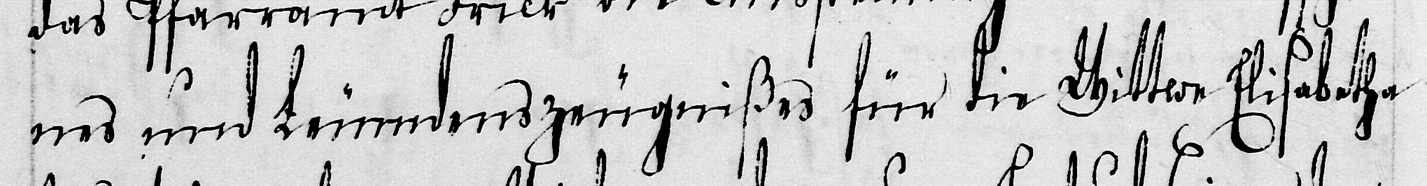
ines und Leumdenszeugnißes für die Wittwe Elisabetha
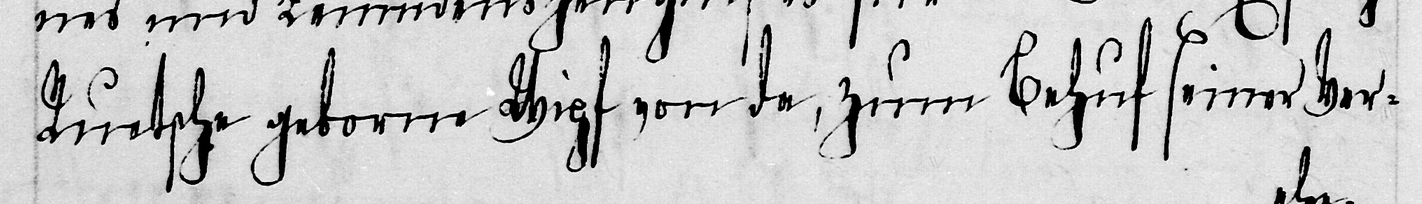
Ruetsche geborne Wipf von da, zum Behuf seiner Ver-
